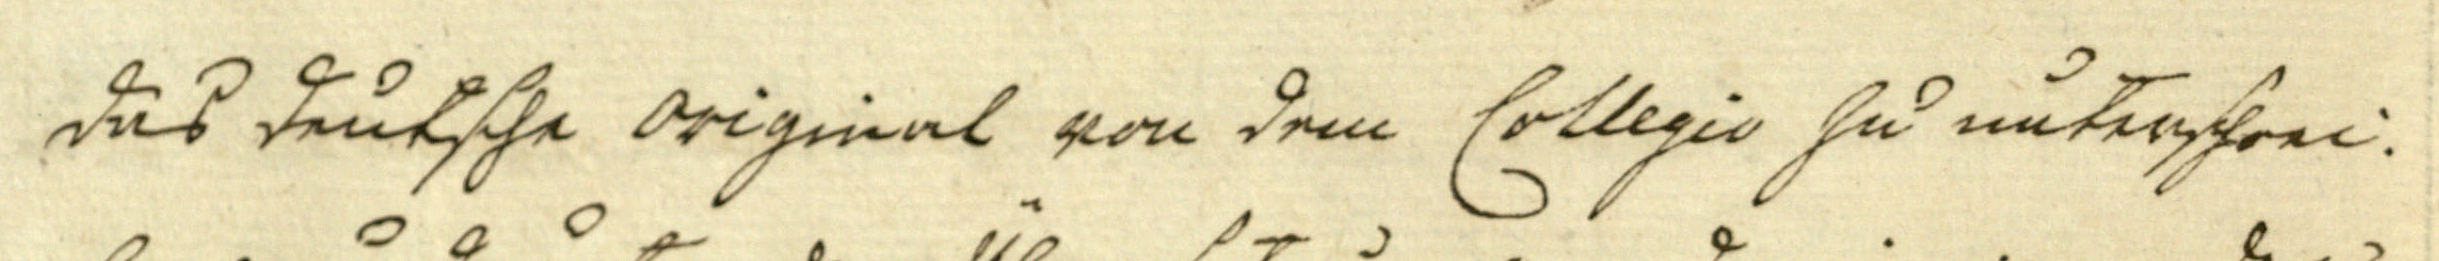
das deutsche Original von dem Collegio zu unterschrei¬
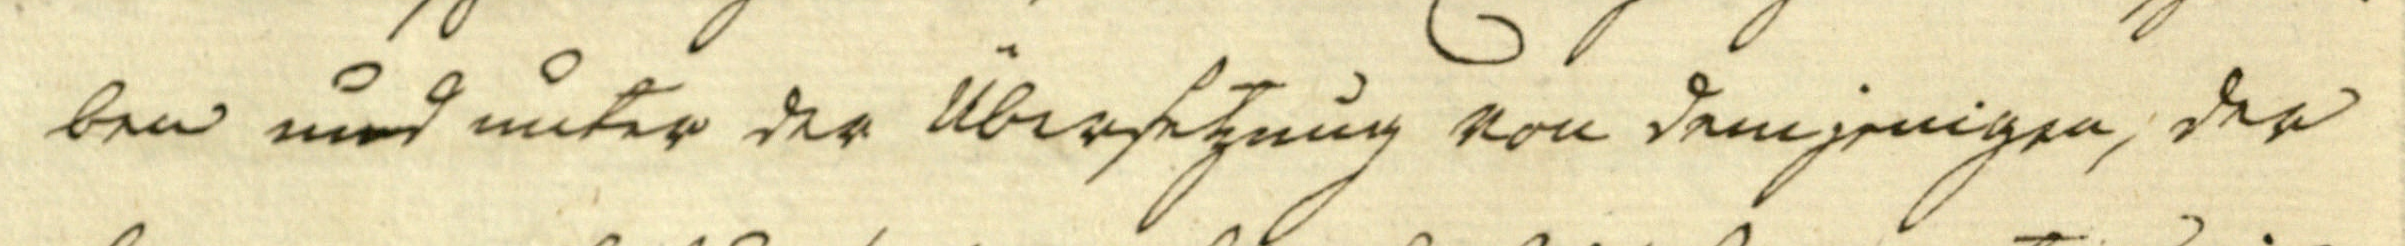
ben und unter der Übersetzung von demjenigen, der
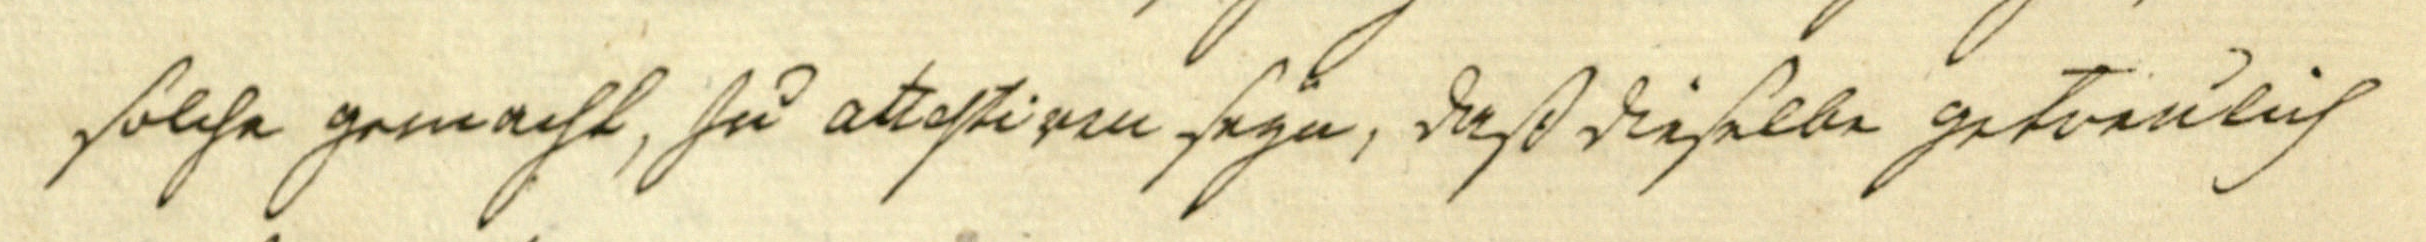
solche gemacht, zu attestiren seÿn, daß dieselbe getreulich
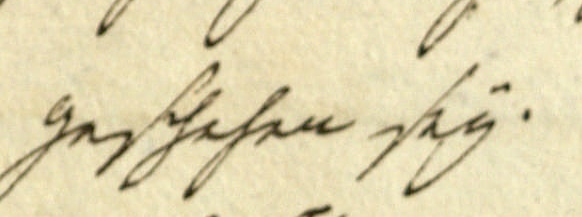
geschehen seÿ.
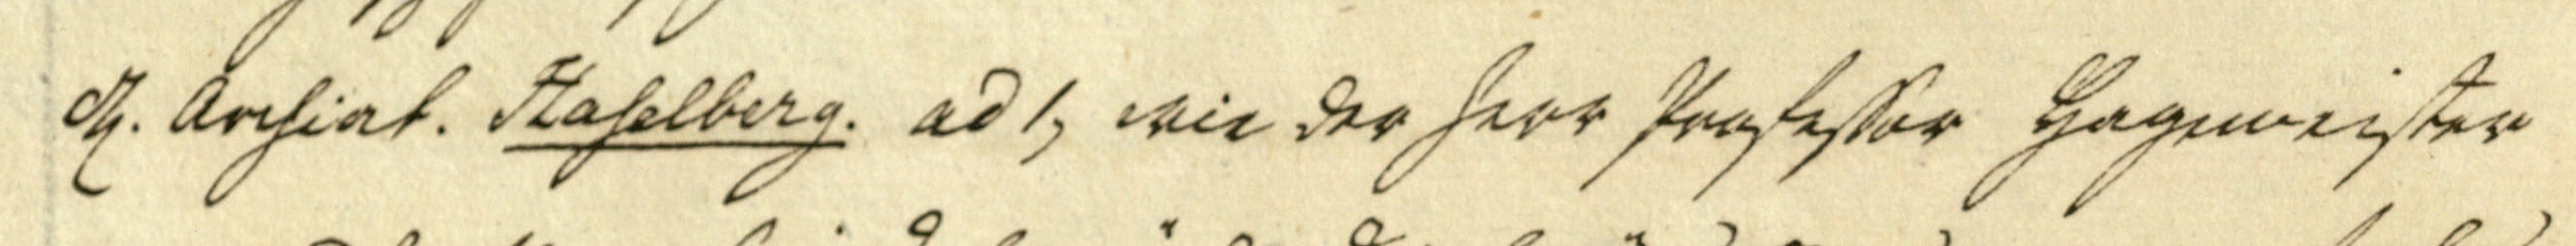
dh. Archiat. Haselberg. ad 1, wie der Herr Professor Hagemeister
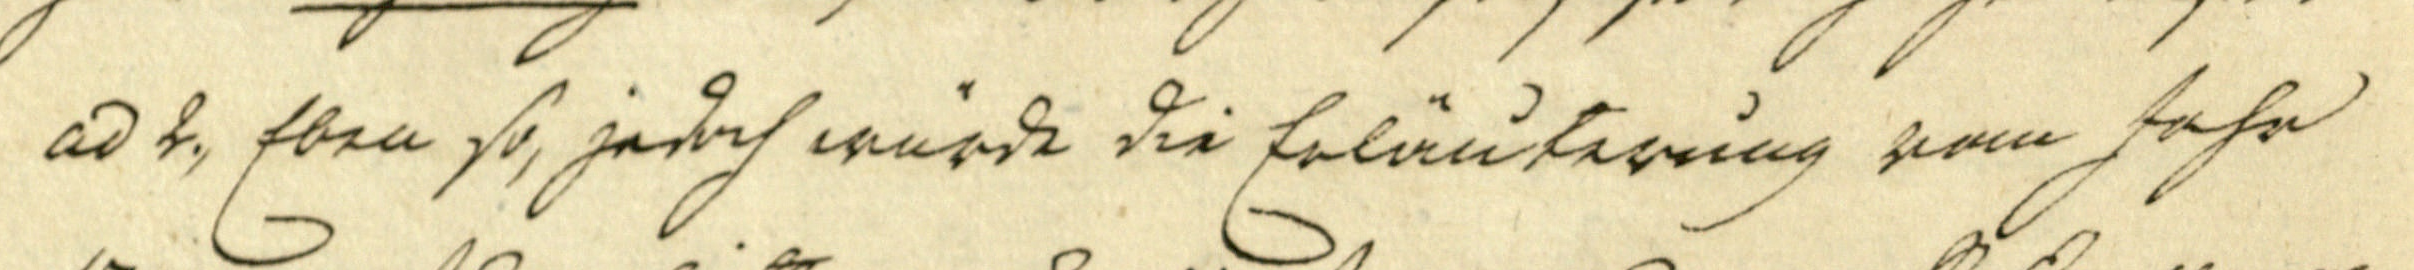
ad 2., Eben so, jedoch würde die Erläuterung vom Jahr
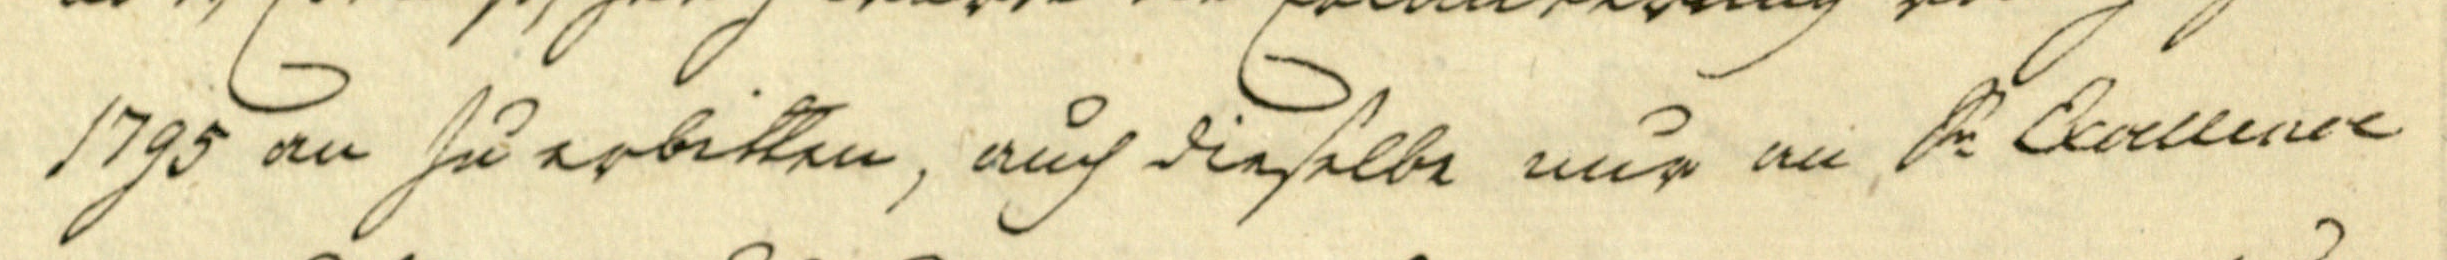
1795 an zu erbitten, auch dieselbe nur an Sr Excellence
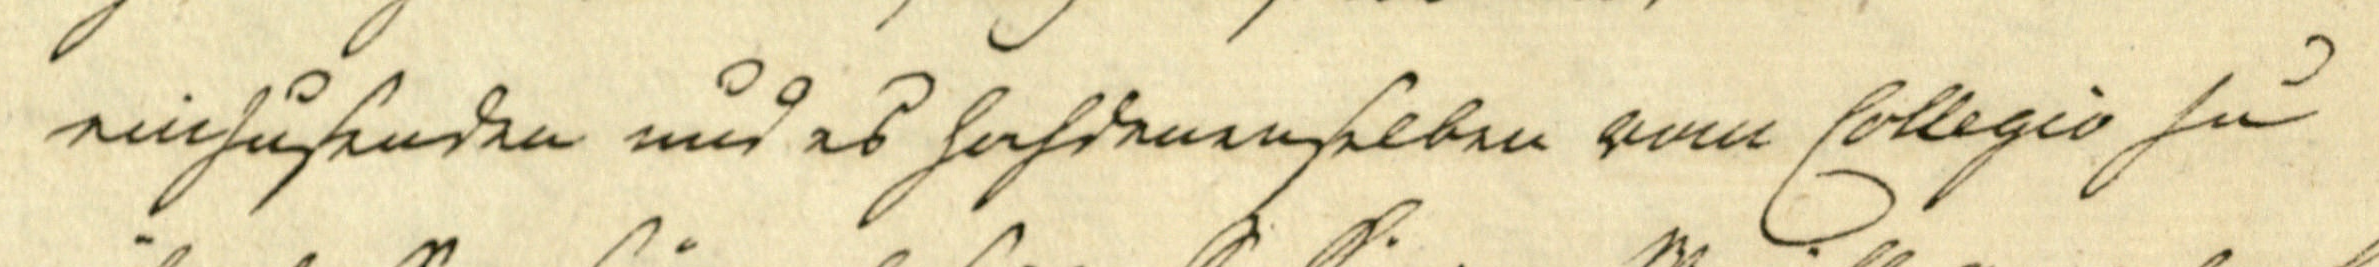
einzusenden und es Hochdenenselben vom Collegio zu
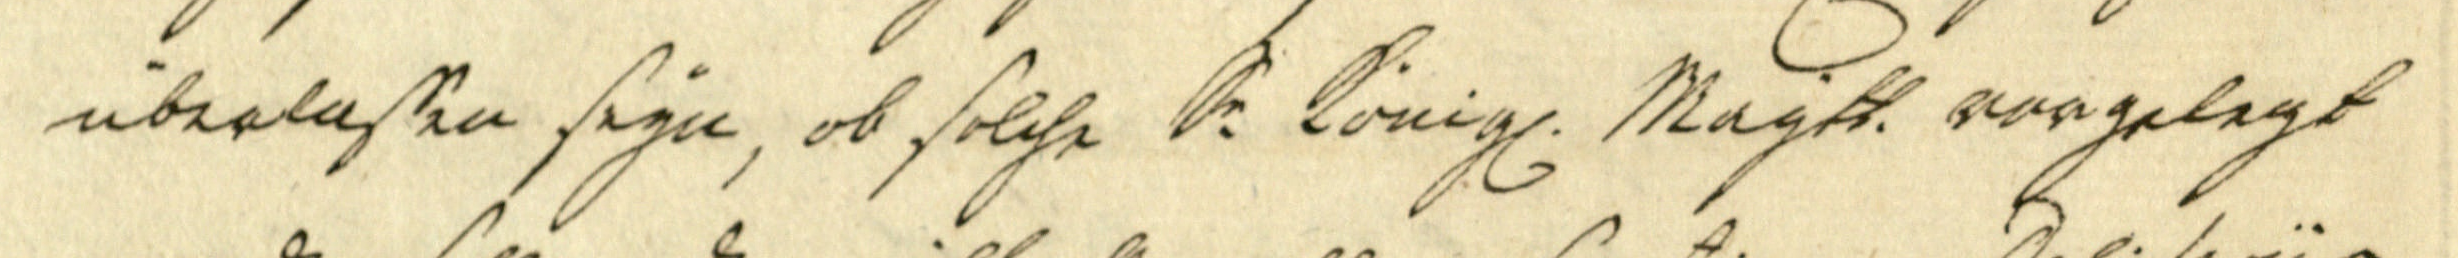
überlassen seÿn, ob solche Sr Königl. Maÿtt. vorgelegt
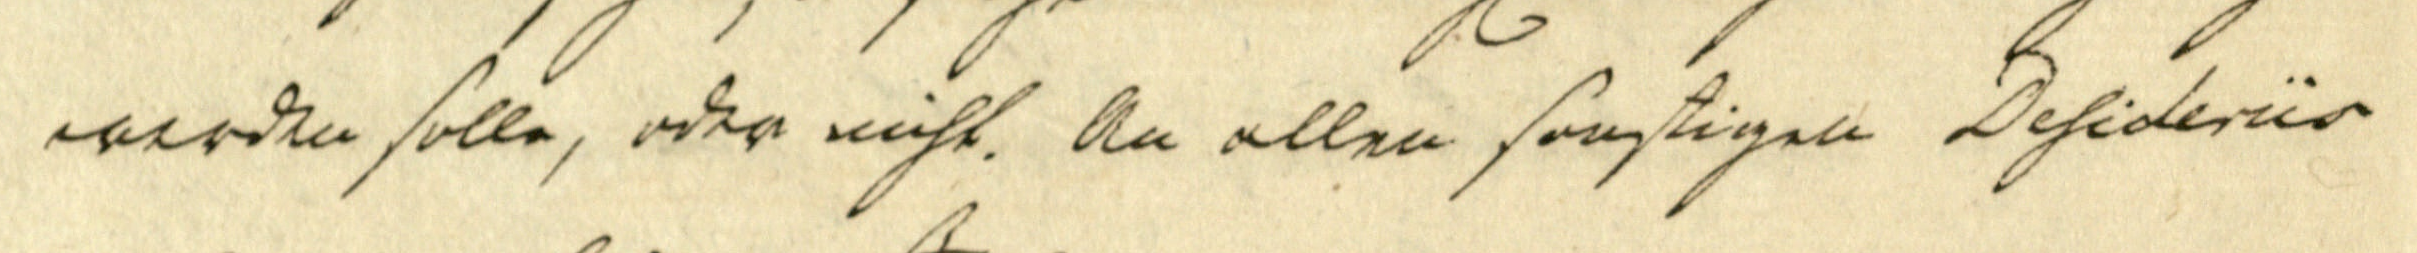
werden solle, oder nicht. An allen sonstigen Desideriis
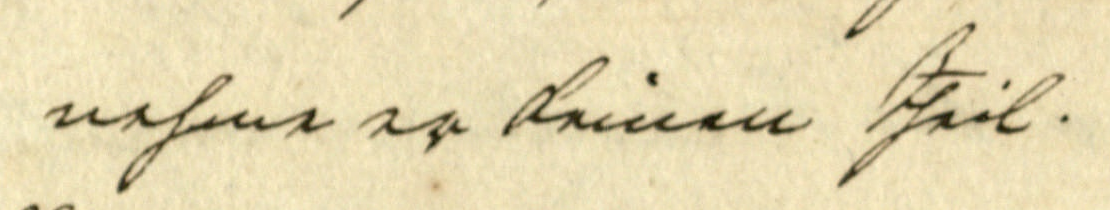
nehme er keinen Theil.
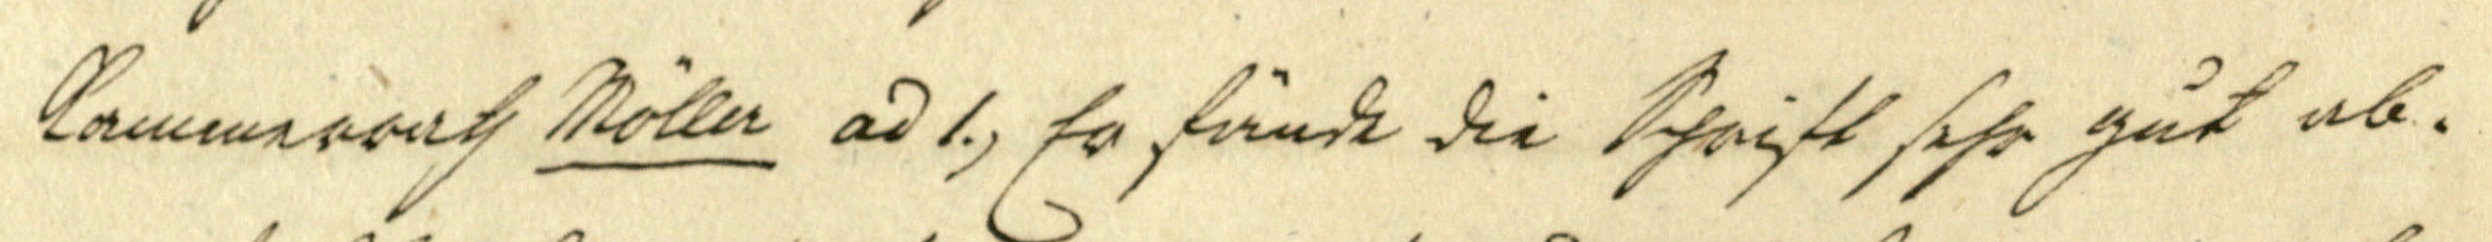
Kammerrath Möller ad 1., Er fände die Schrift sehr gut ab¬
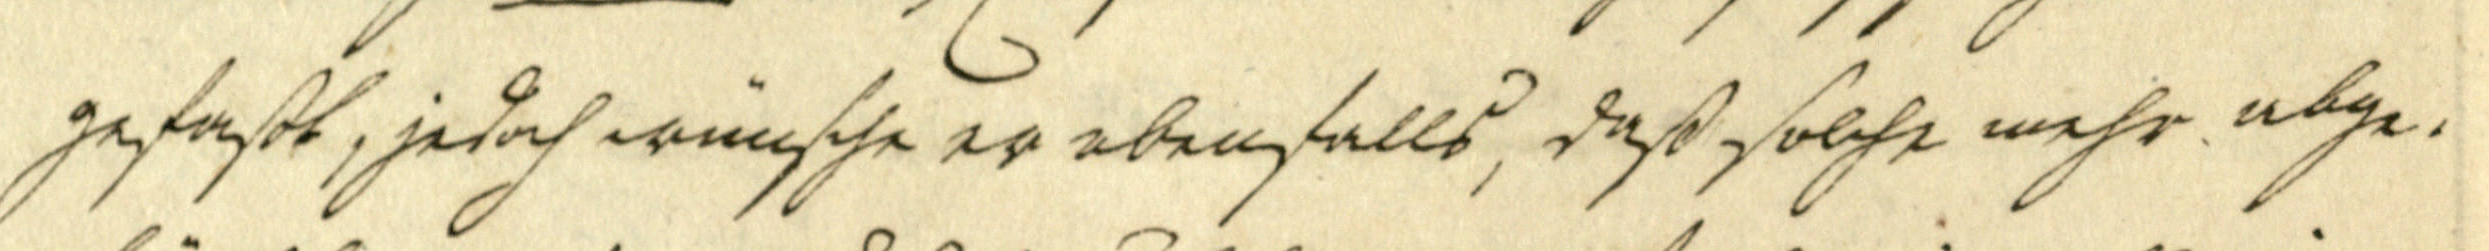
gefaßt, jedoch wünsche er ebenfalls, daß solche mehr abge¬
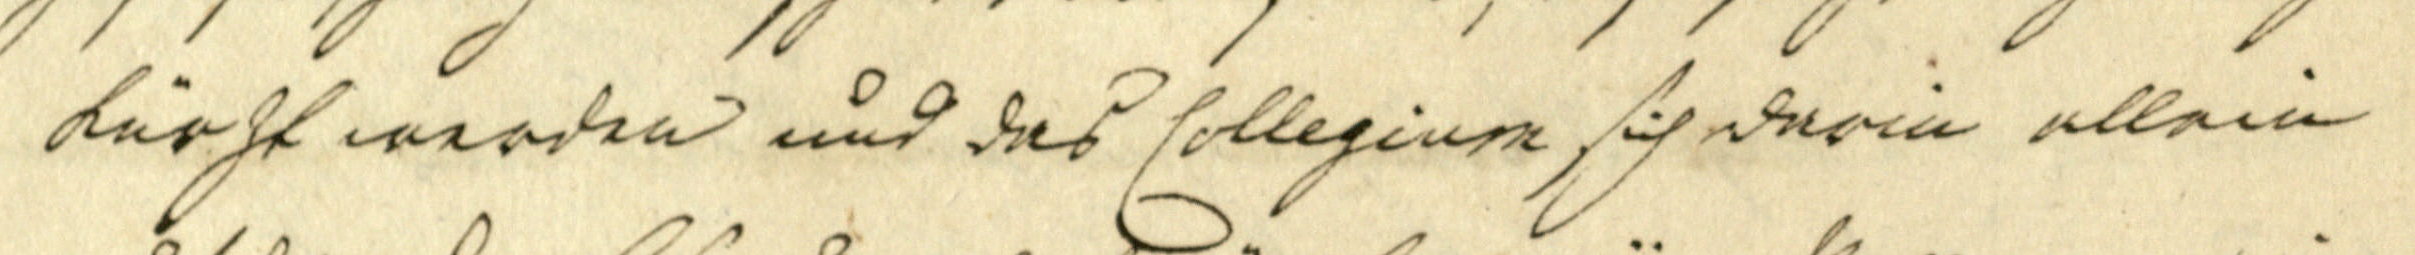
kürzt werden und das Collegium sich darin allein
